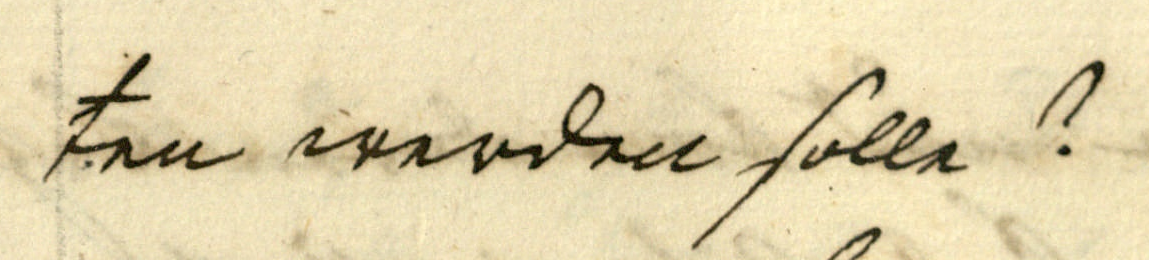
ten werden solle?
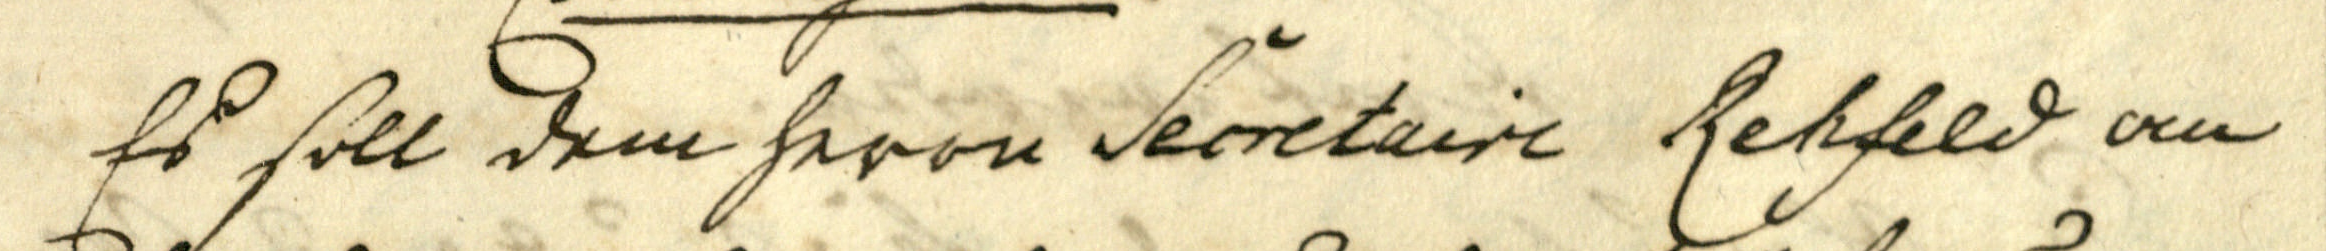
Es soll dem Herrn Secretaire Rehfeld an
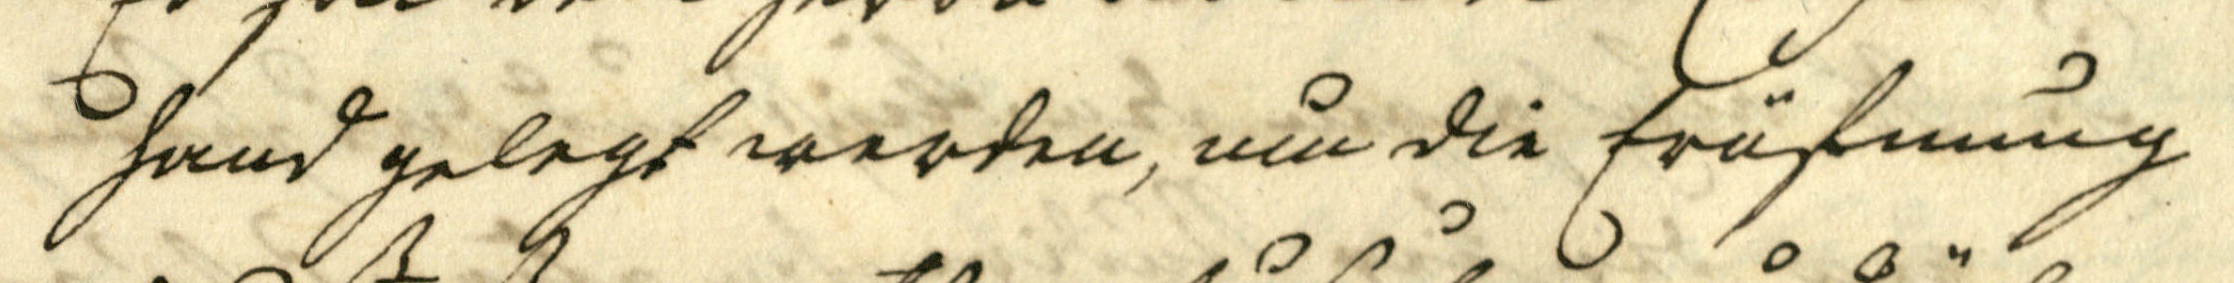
Hand gelegt werden, nun die Eröfnung
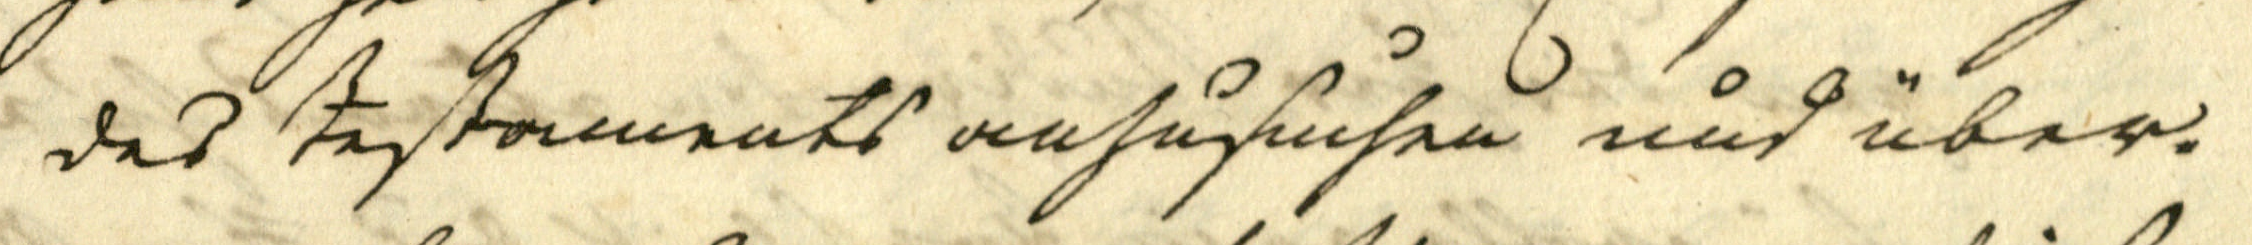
des Testaments anzusuchen und über¬
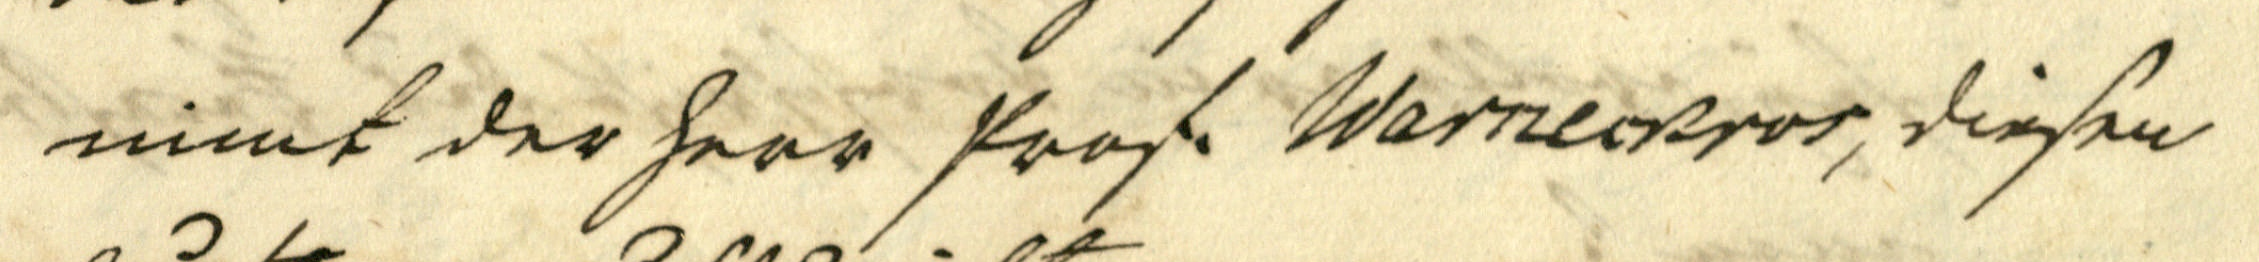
nimmt der Herr Prof. Warneckros, diesen
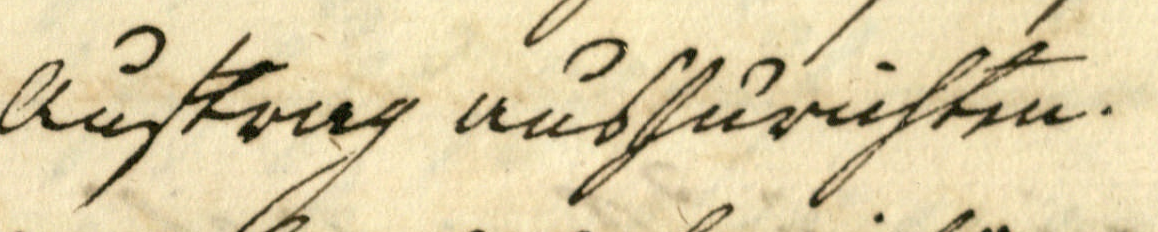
Auftrag auszurichten.
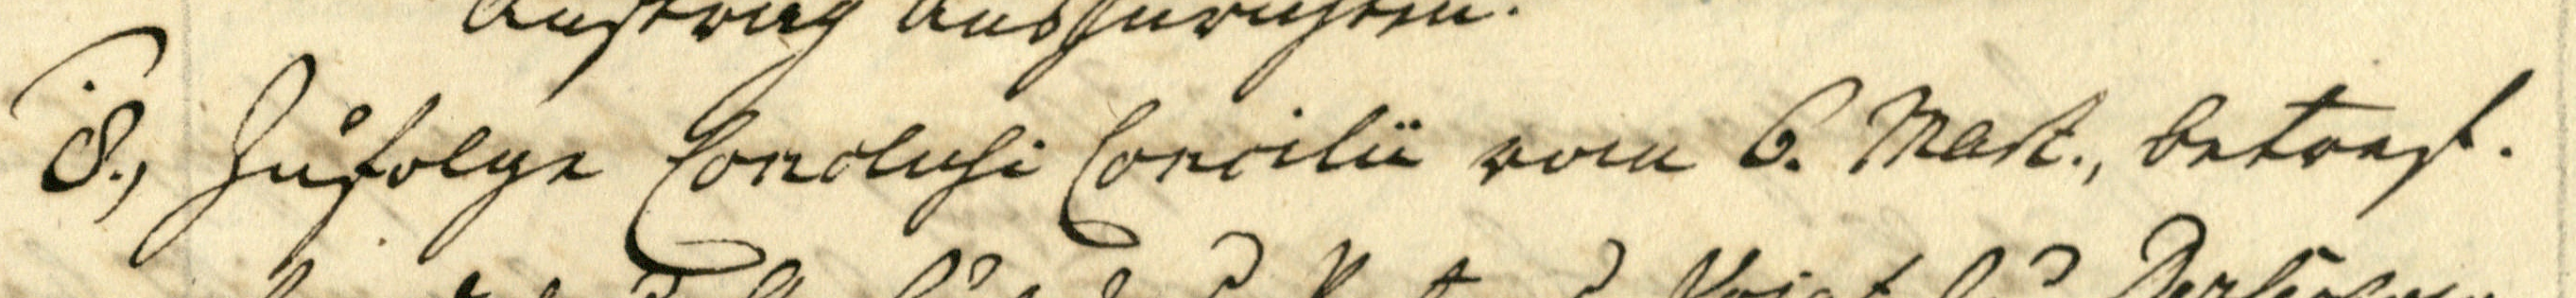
8., Zufolge Conclusi Concilii vom 6. Mart, betref¬
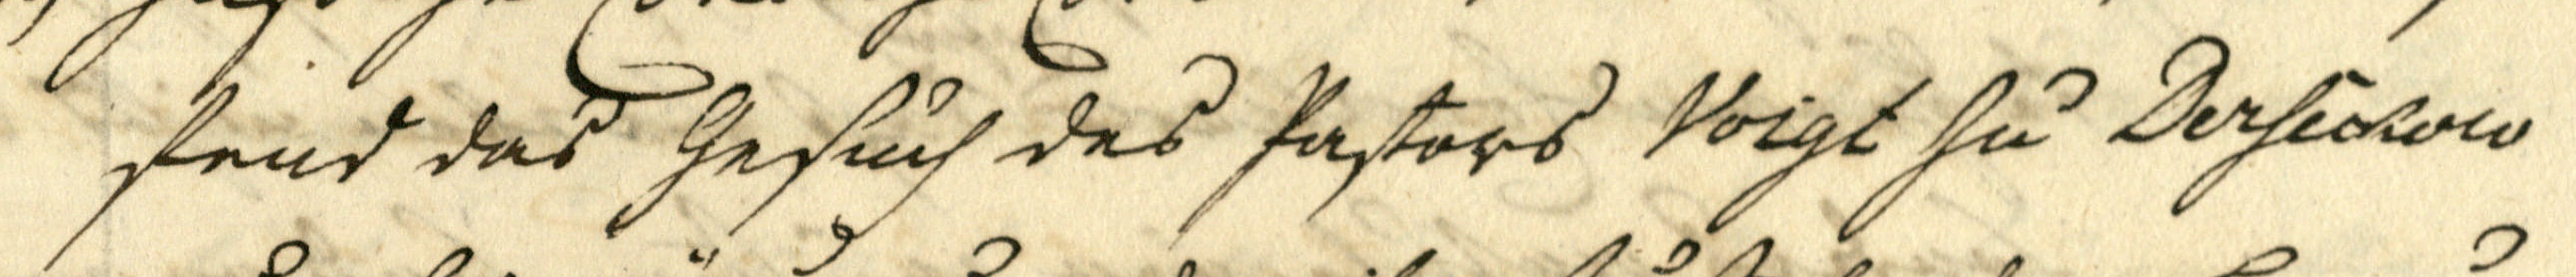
fend das Gesuch des Pastors Voigt zu Derseckow
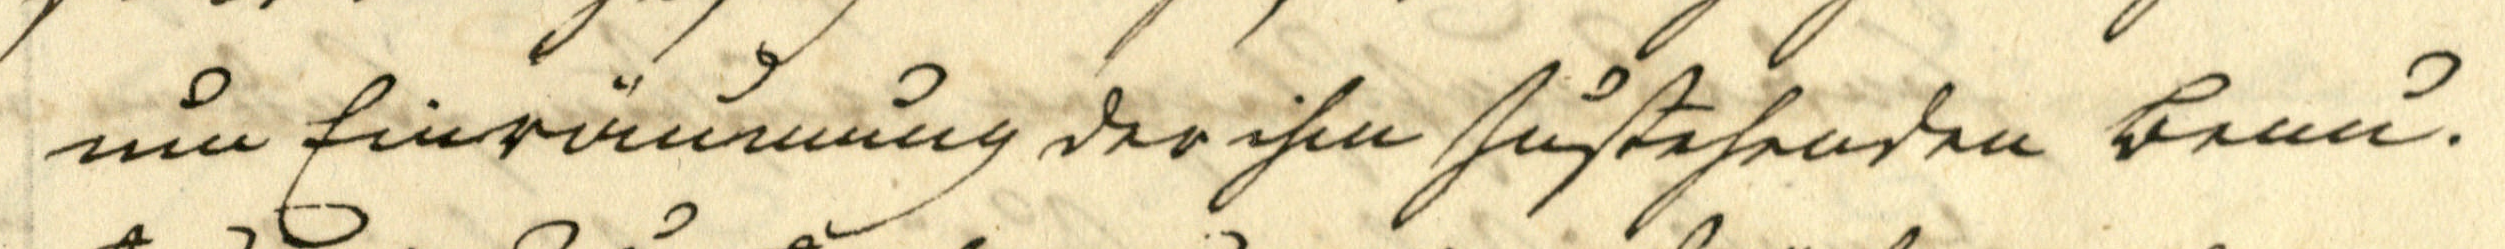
um Einräumung der ihm zustehenden Benu¬
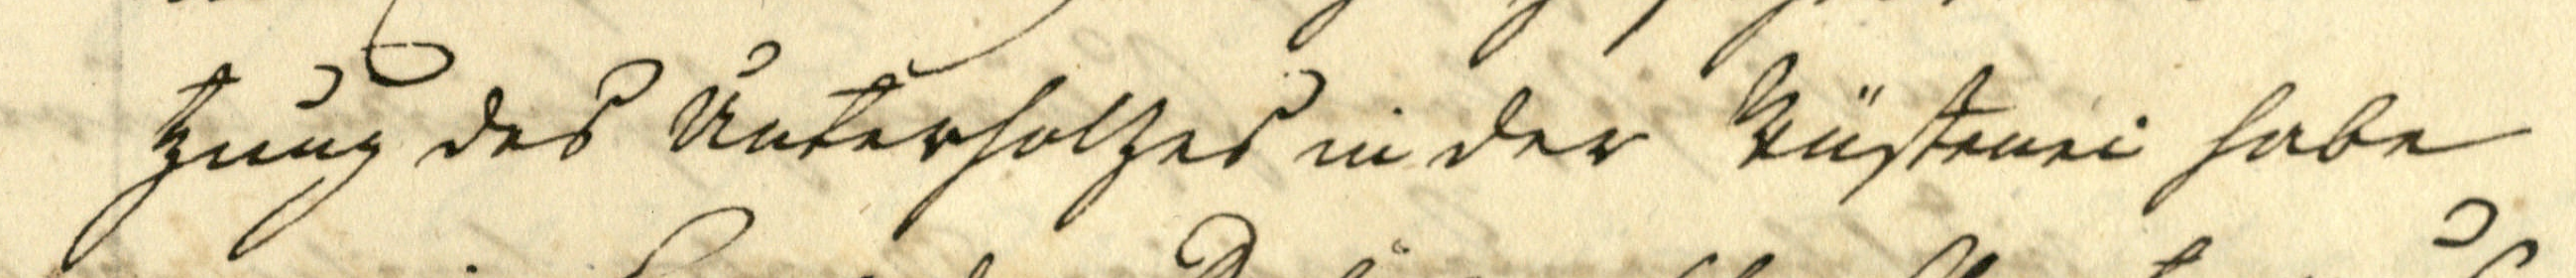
tzung des Unterholzes in der Wüstenei habe
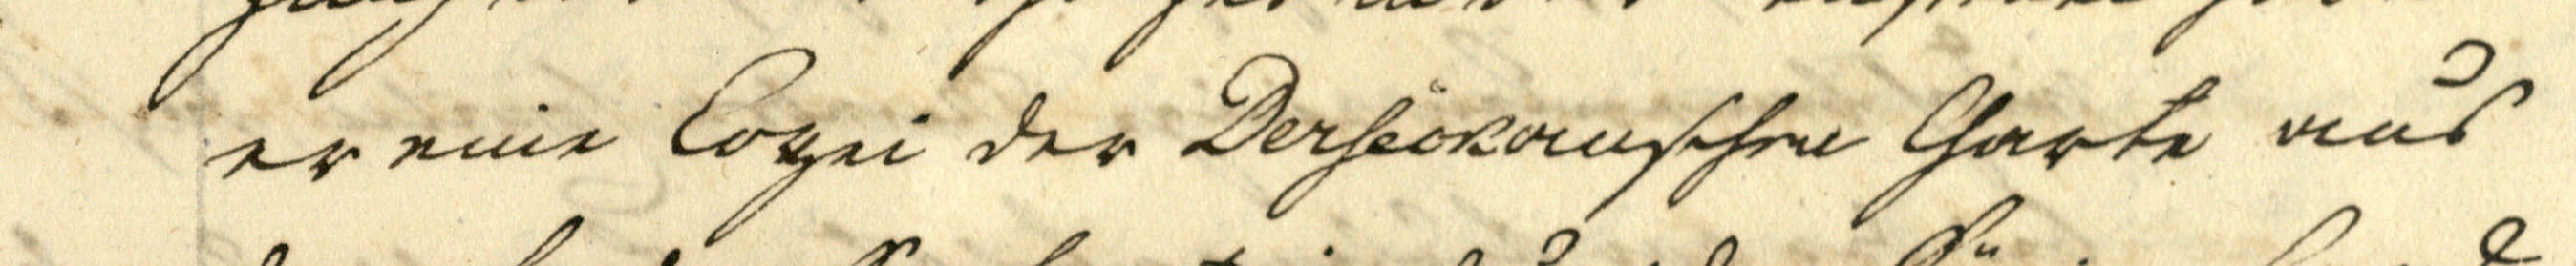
er eine Copei der Derseckowschen Charte aus
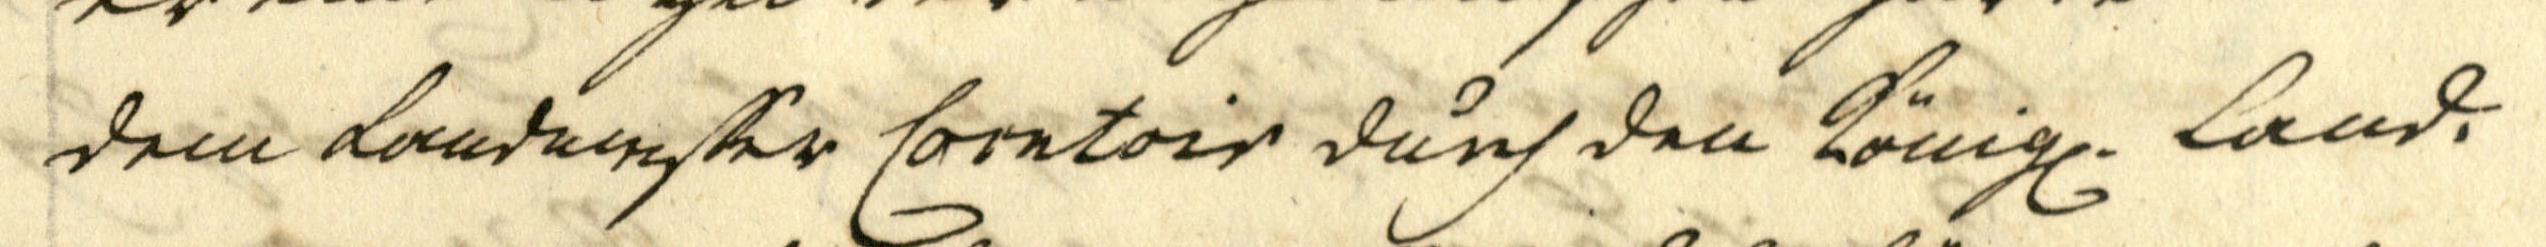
dem Landmesser Comtoir durch den Königl. Land¬
